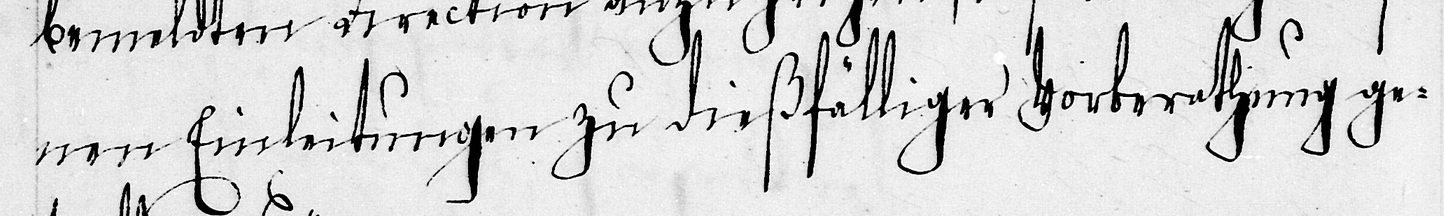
nen Einleitungen zu dießfälliger Vorberathung ge¬
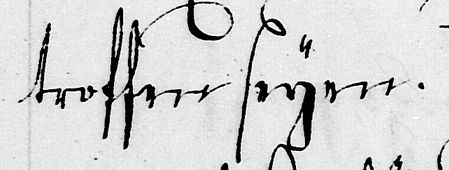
troffen seyen.
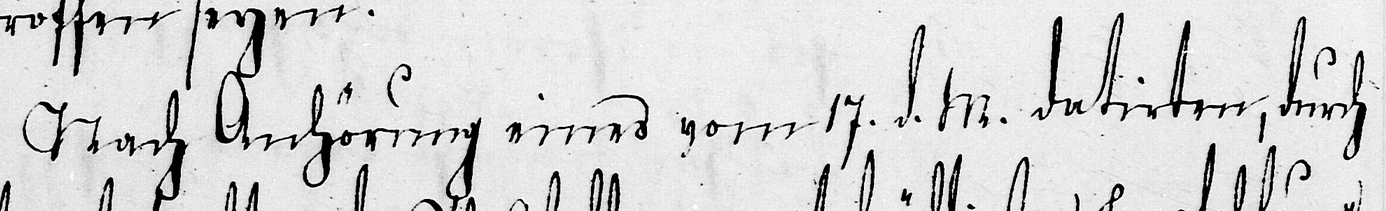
Nach Anhörung eines vom 17. d. M. datirten, durch
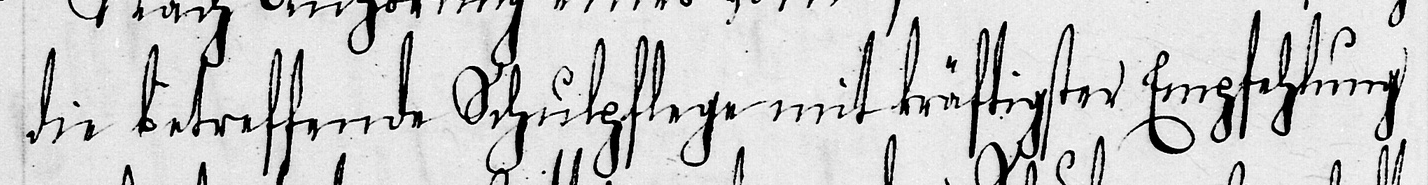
ie betreffende Schulpflege mit kräftigster Empfehlung
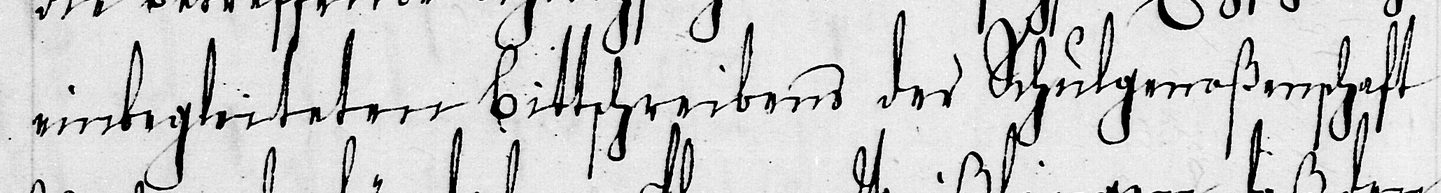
einbegleiteten Bittschreibens der Schulgenoßenschaft
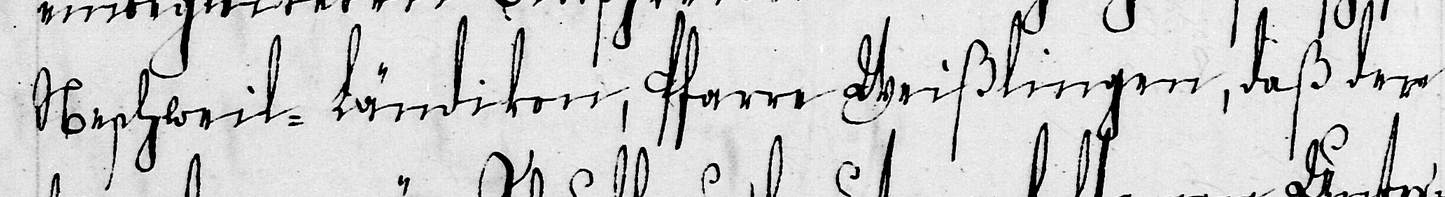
Neschweil-Ländikon, Pfarre Weißlingen, daß der
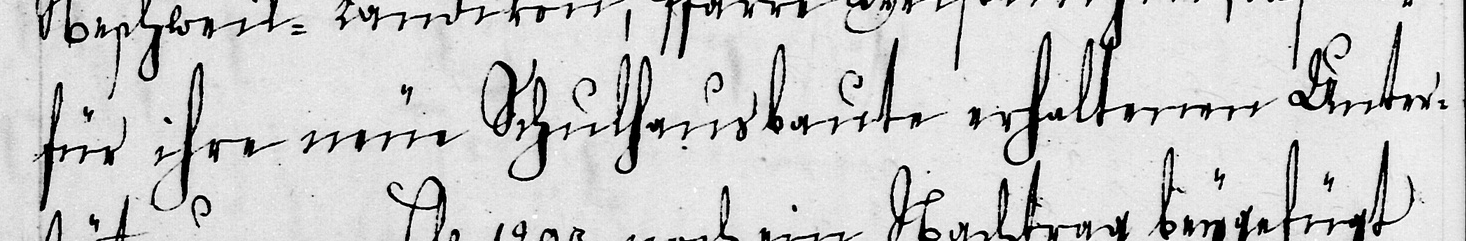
für ihre neue Schulhausbaute erhaltenen Unter¬
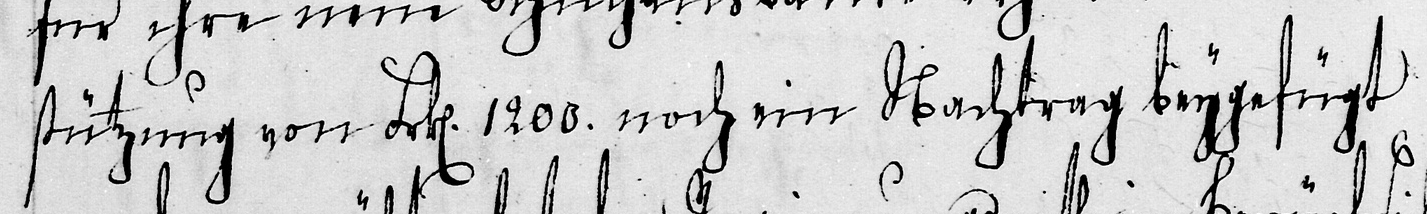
stützung von Frk[en]. 1200. noch ein Nachtrag beygefügt
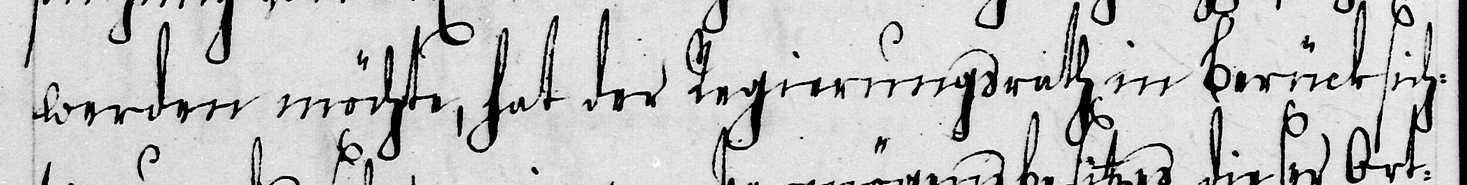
werden möchte, hat der Regierungsrath in Berücksich¬
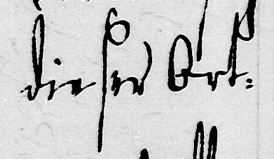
dieser Ort-
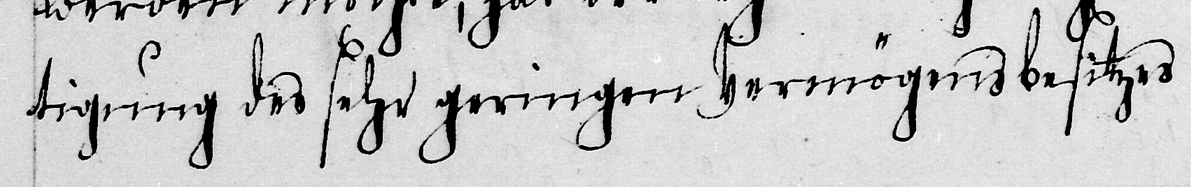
tigung des sehr geringen Vermögensbesitzes
